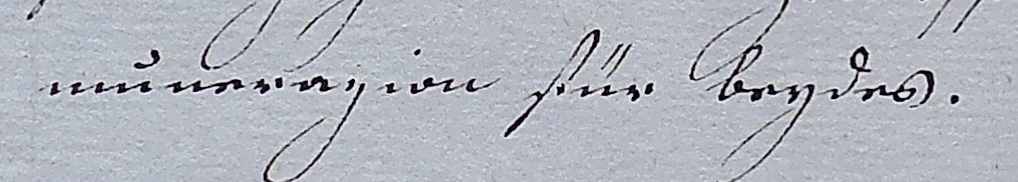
muerazion für beydes.
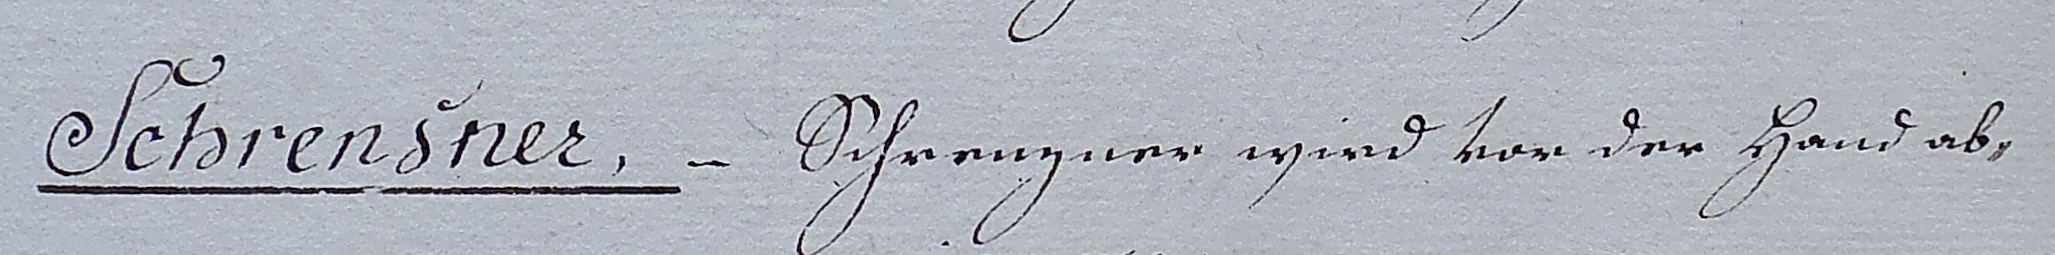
Schrensner, .. Schrenzner wird vor der Hand ab¬
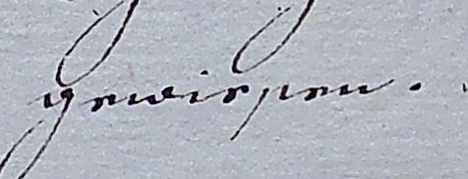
gewiesen.
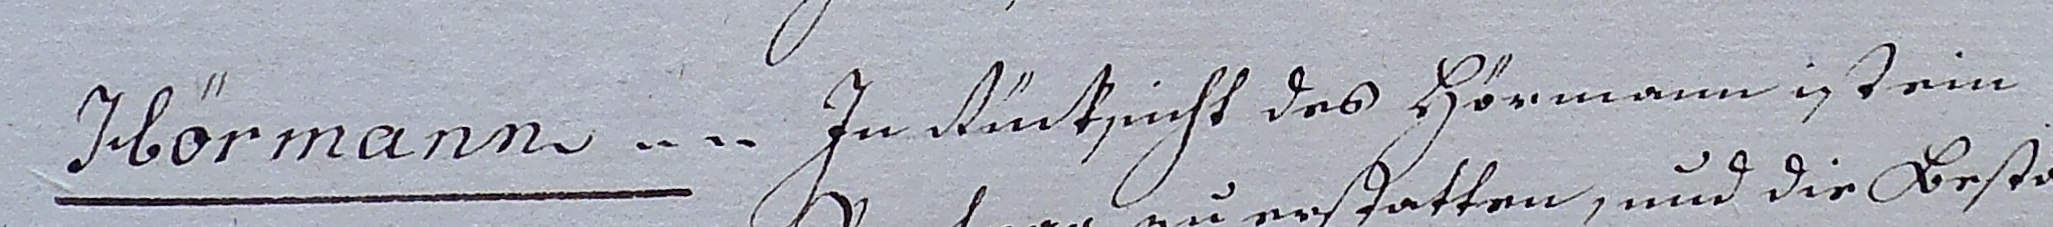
Hörmann .. .. In Rücksicht des Hörmann ist ein
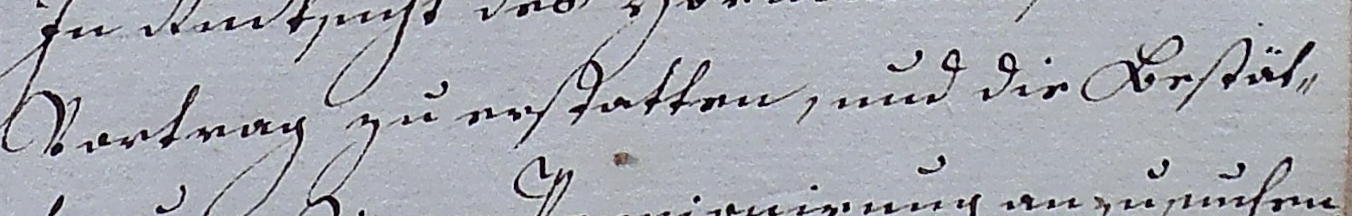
Vortrag zu erstatten, und die Bestät¬
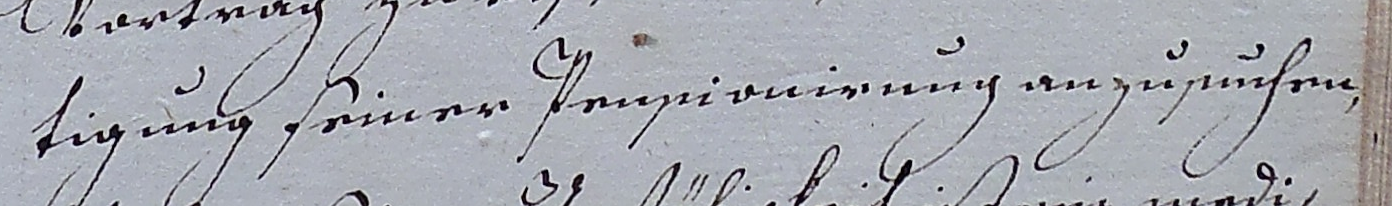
tigung seiner Pensionirung anzusuchen.
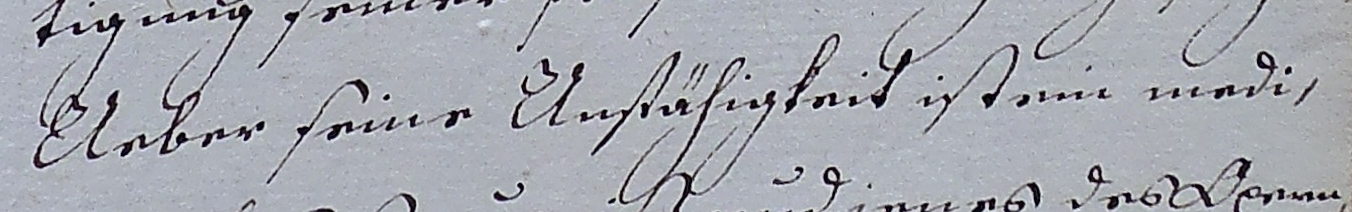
Ueber seine Unfähigkeit ist ein medi¬
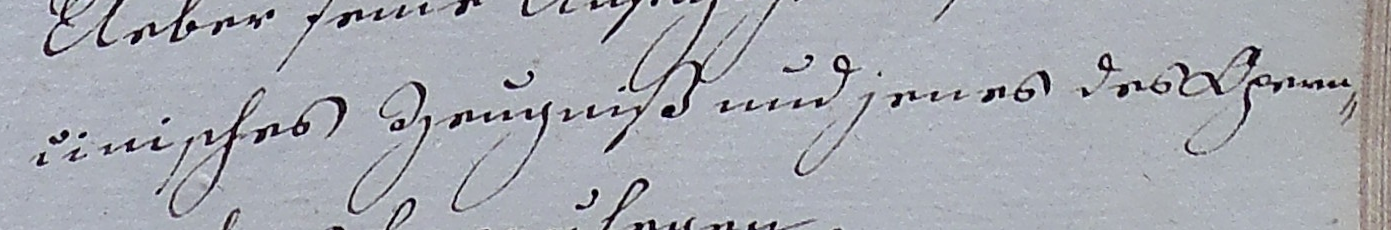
cisches Zeugniß und jenes des Opern¬
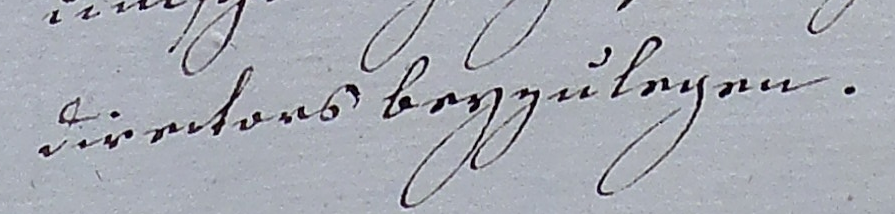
directors beyzulegen.
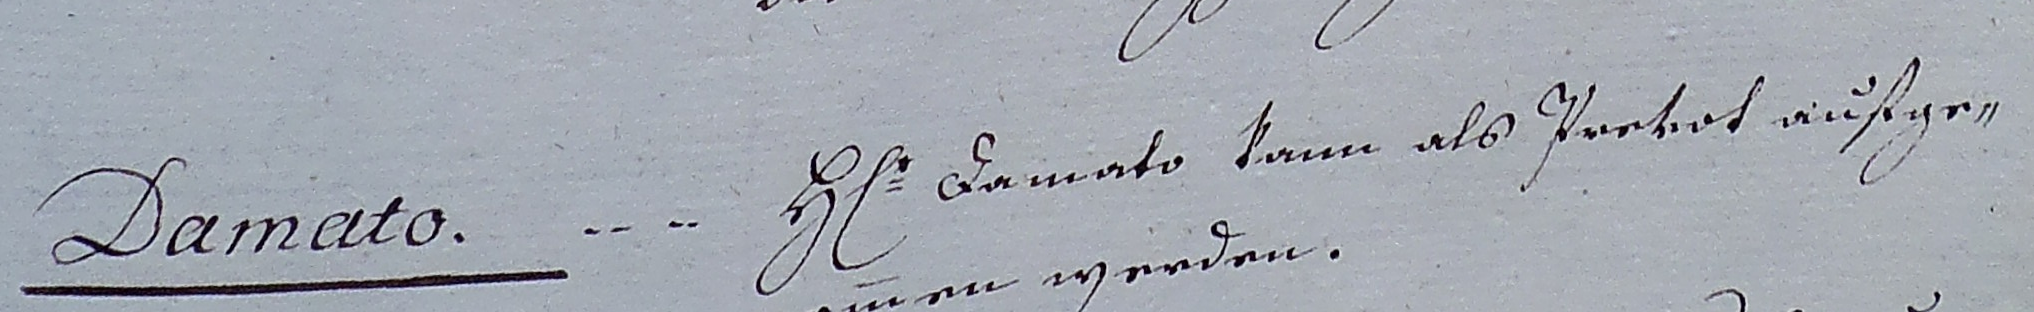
Damato. .. .. HEr͇ Damato kann als Prevot aufge¬
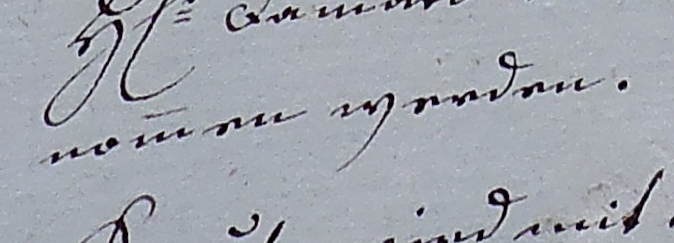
nom̅en werden.
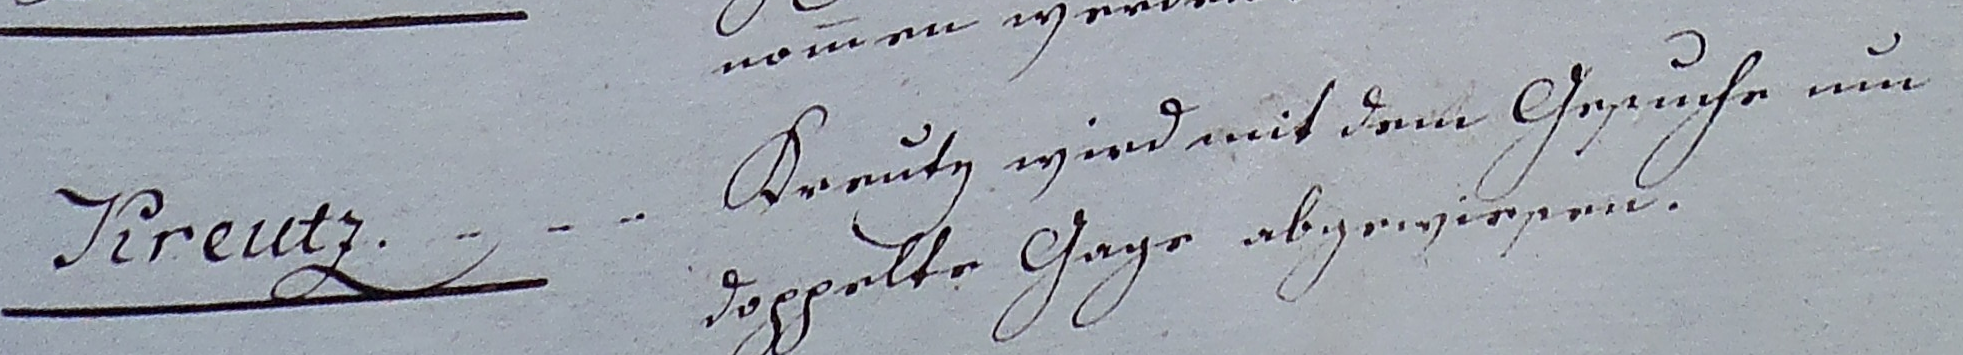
Kreutz. .. .. .. Kreutz wird mit dem Gesuche um
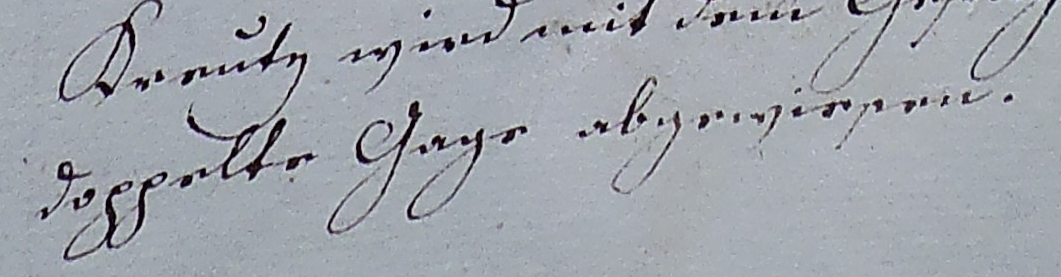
doppelte Gage abgewiesen.
